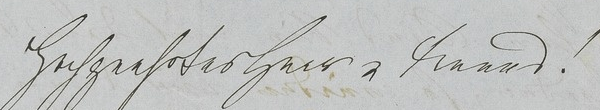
Hochgeehrter Herr & Freund!
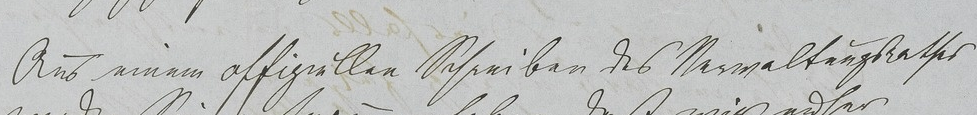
Aus einem offiziellen Schreiben des Verwaltungsrathes
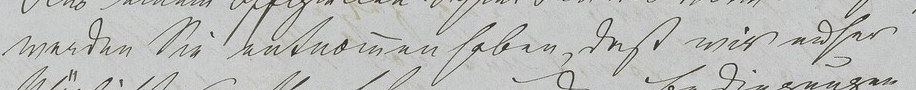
werden Sie entnommen haben, daß wir unser
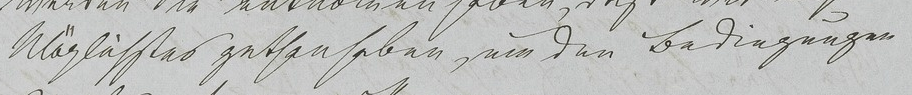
Möglichstes gethan haben, um den Bedingungen
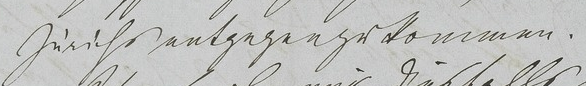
Zürichs entgegenzukommen. –
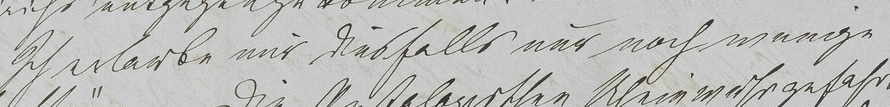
Ich erlaube mir diesfalls nur noch wenige
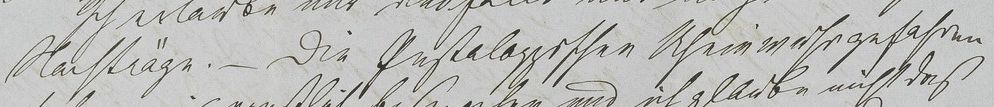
Nachträge. – Die PestalozzischenRheinwuhrgefahren
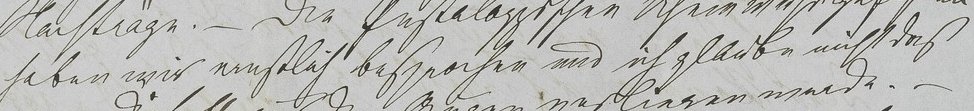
haben wir ernstlich besprochen und ich glaube nicht daß
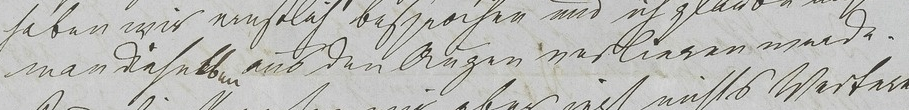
man dieselben aus den Augen verlieren werde. –
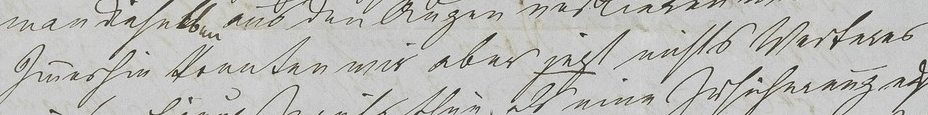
Immerhin konnten wir aber jezt nichts Weiteres
